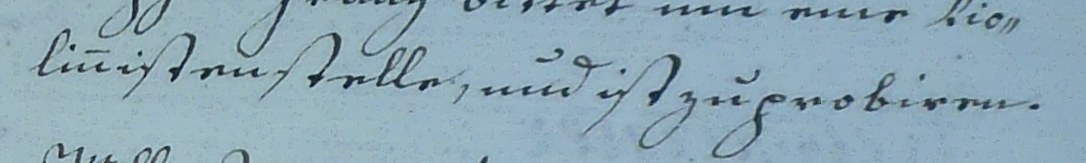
lin̅istenstelle, und ist zuprobiren.
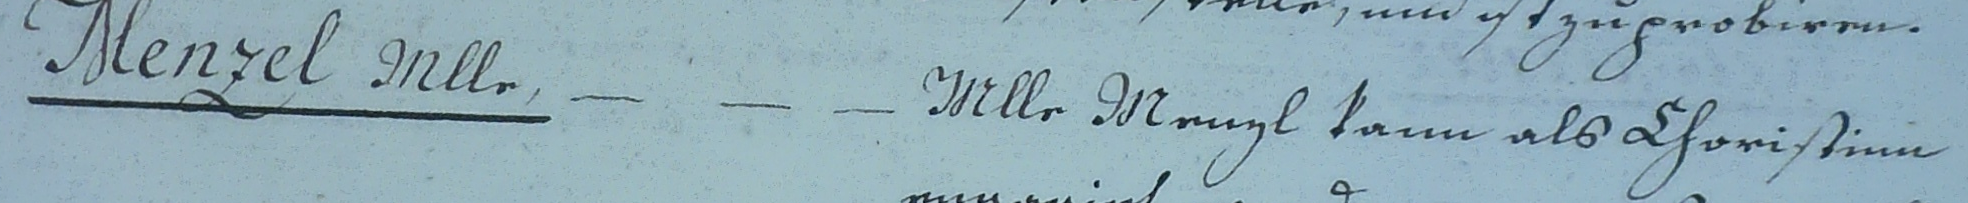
Menzel Mlle, _ _ _ Mlle Menzl kann als Choristinn
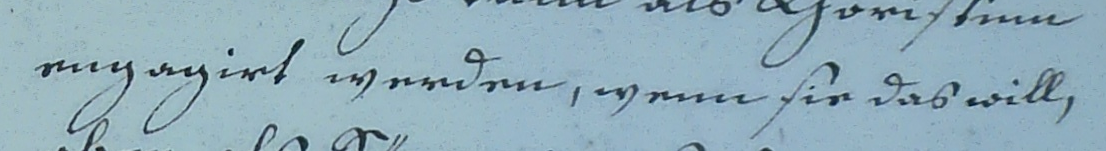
engagirt werden, wenn sie das will,
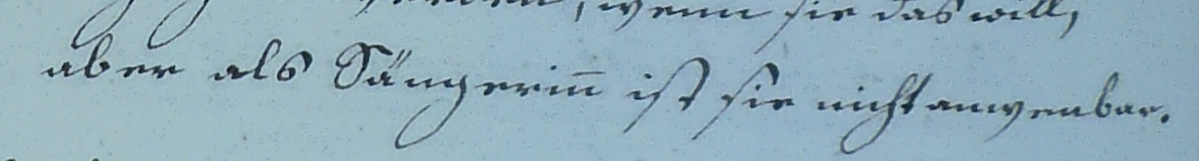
aber als Sängerin̅ ist sie nicht anwenbar.
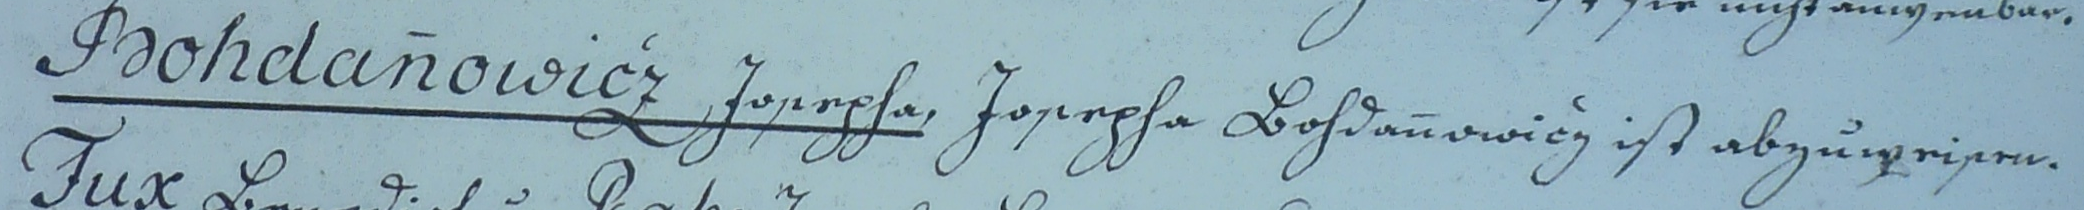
Bohdan̅owićz Josepha, Josepha Bohdan̅owićz ist abzuweisen.
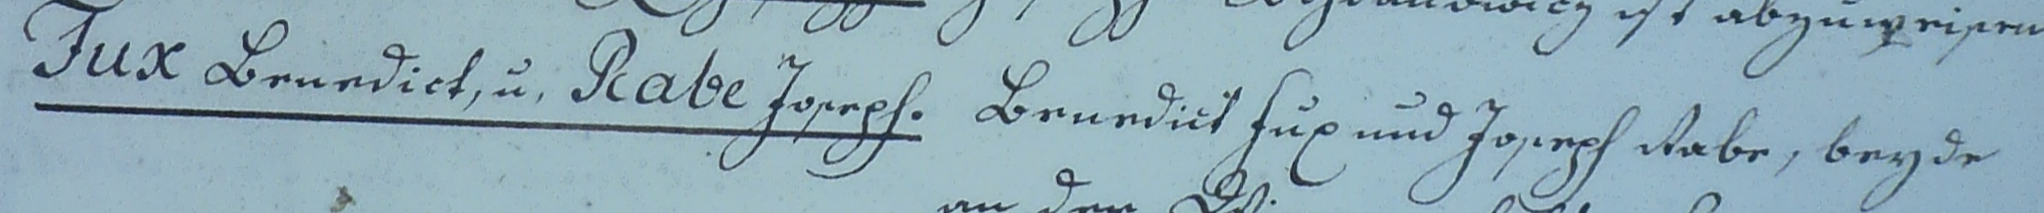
Fux Benedict, u. Rabe Joseph. Benedict Fux und Joseph Rabe, beyde
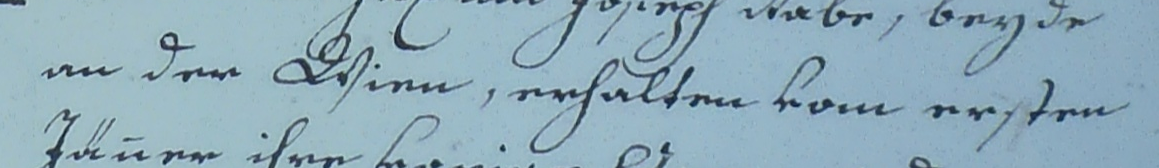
an der Wien, erhalten vom ersten
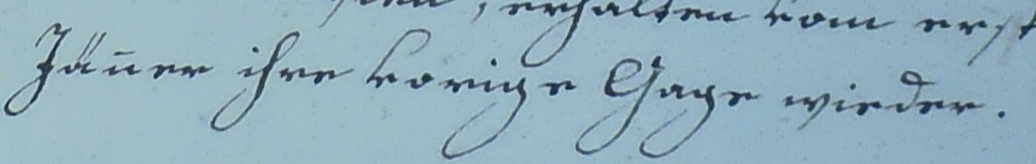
Jän̅er ihre vorige Gage wieder.
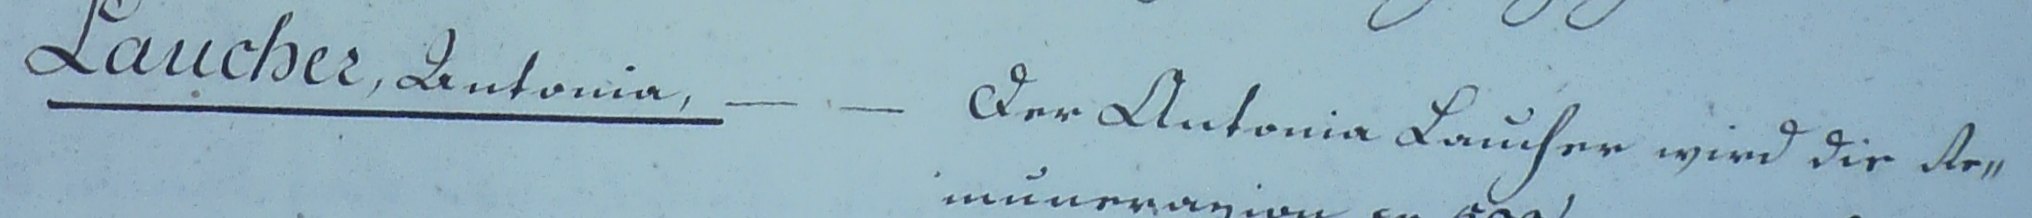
Laucher, Antonia, _ _ Der Antonia Laucher wird die Re¬
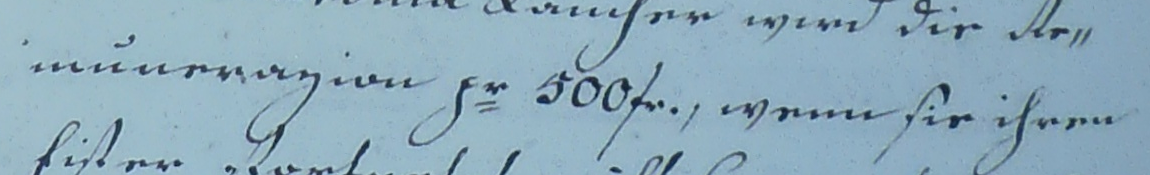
munerazion pr 500fr., wenn sie ihren
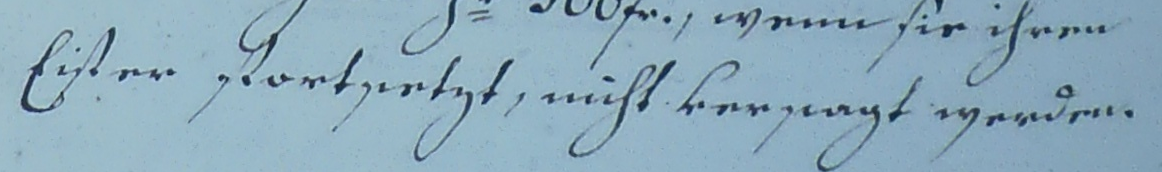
Eifer fortsetzt, nicht versagt werden.
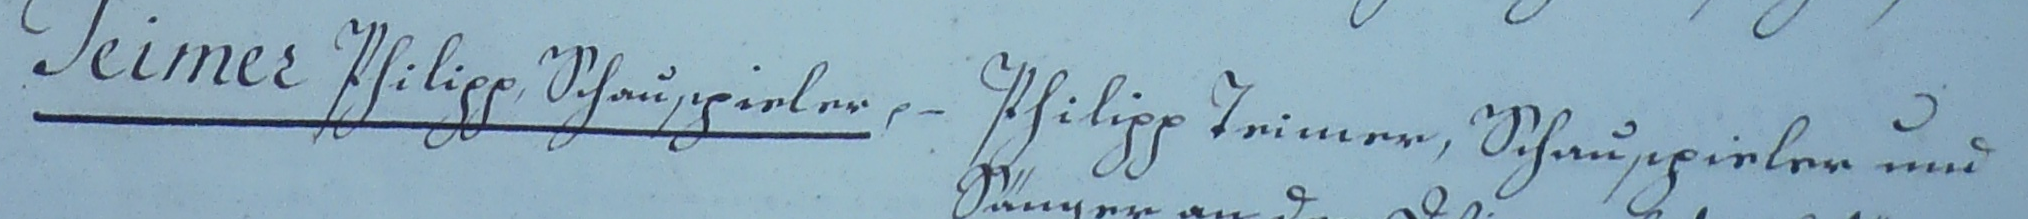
Teimer Philipp, Schauspieler, _ Philipp Teiner, Schauspieler und
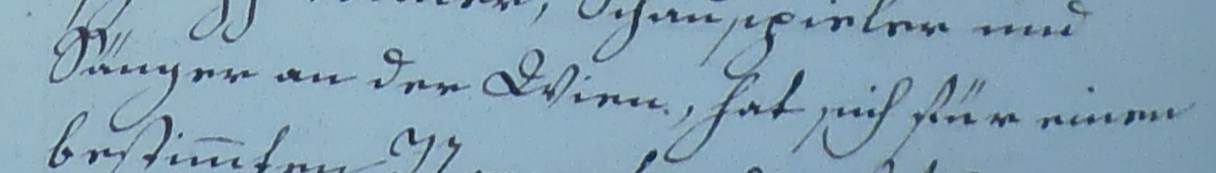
Sänger an der Wien, hat sich für einen
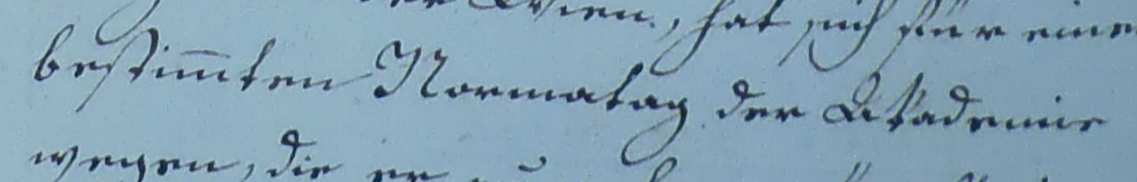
bestim̅ten Normatag der Akademie
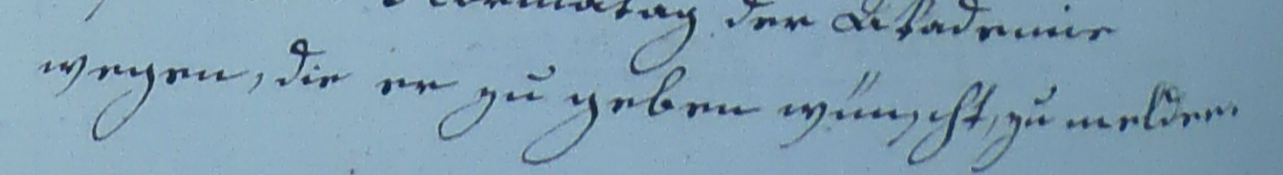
wegen, die er zu geben wünscht, zu melden.
